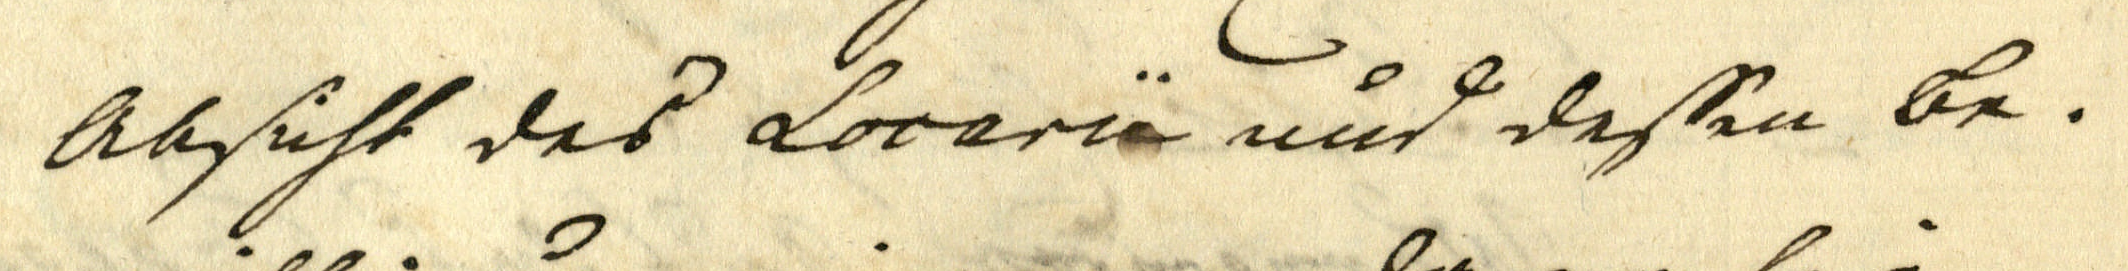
Absicht des Locarii und dessen Be¬
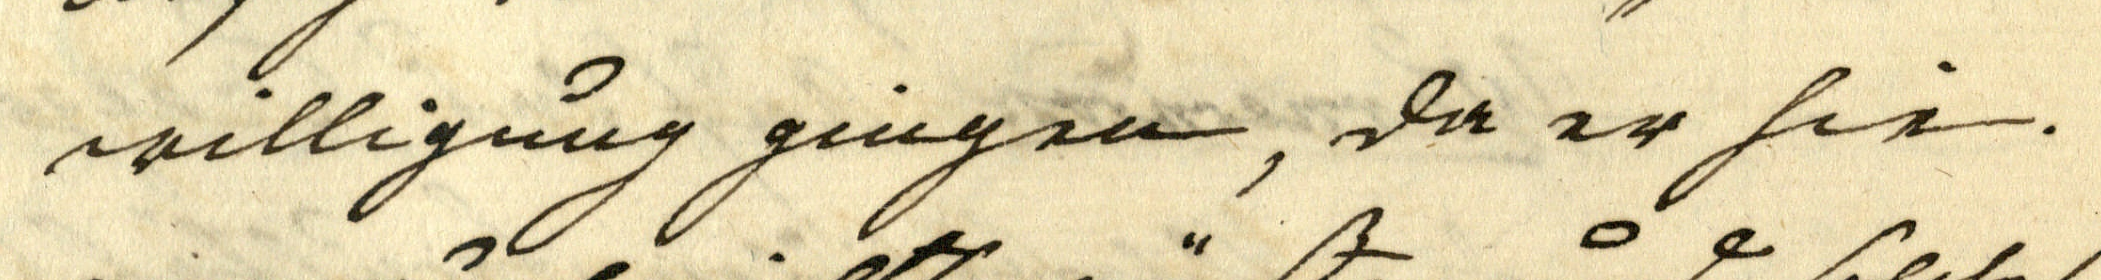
willigung gingen, da er hie¬
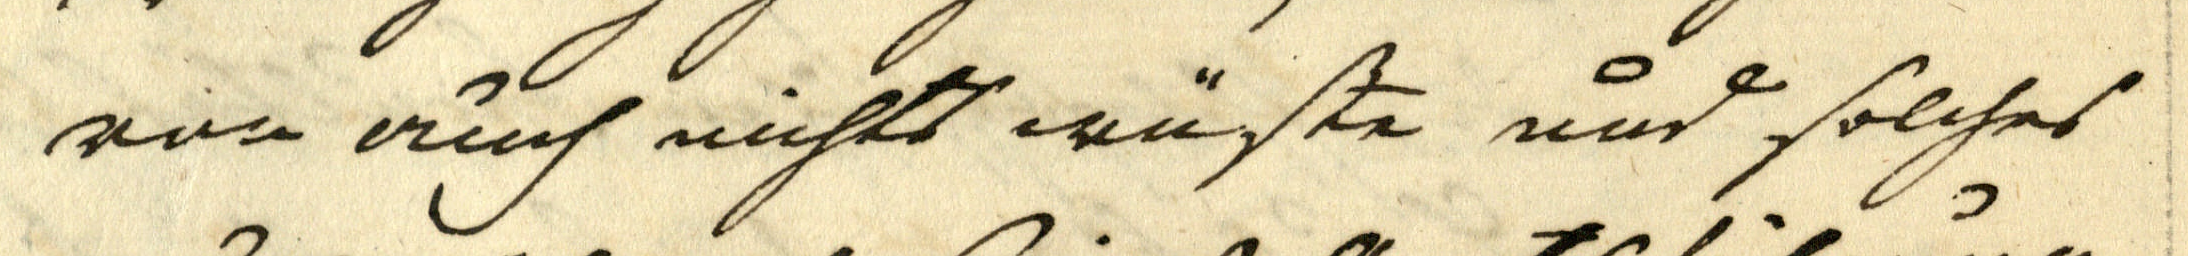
von auch nichts wüßte und solches
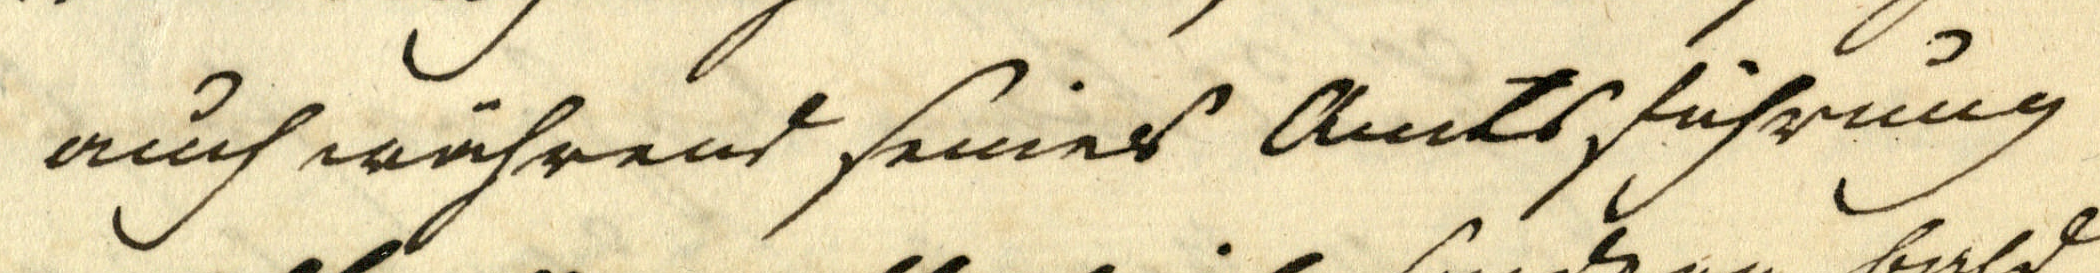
auch während seiner Amts führung
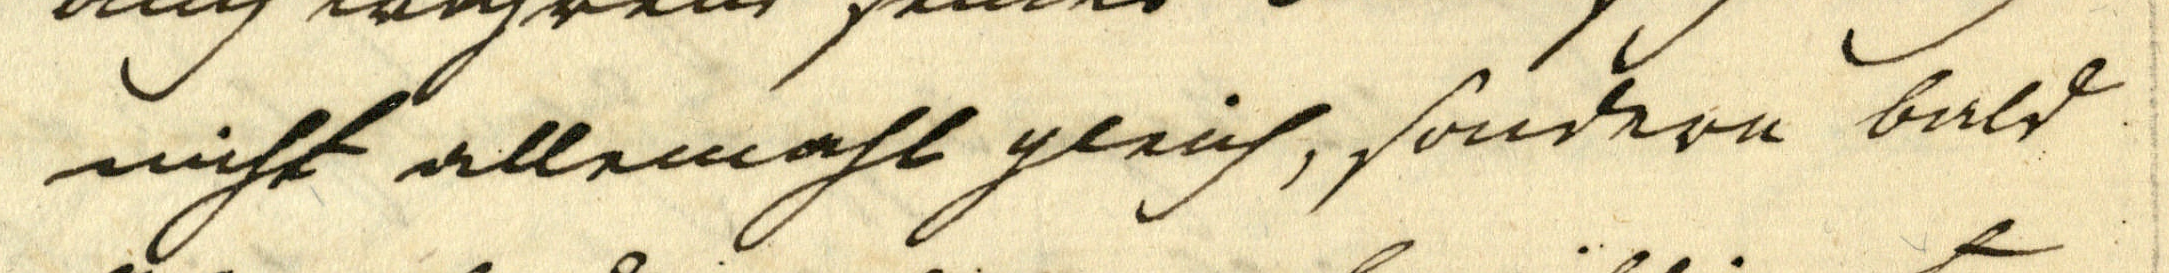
nicht allemahl gleich, sondern bald
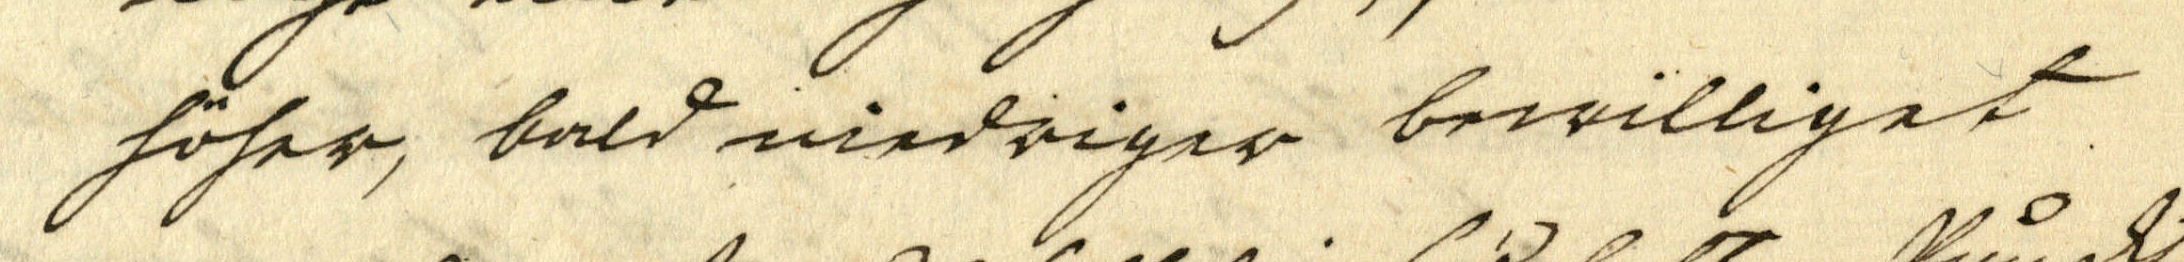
höher, bald niedriger bewilliget
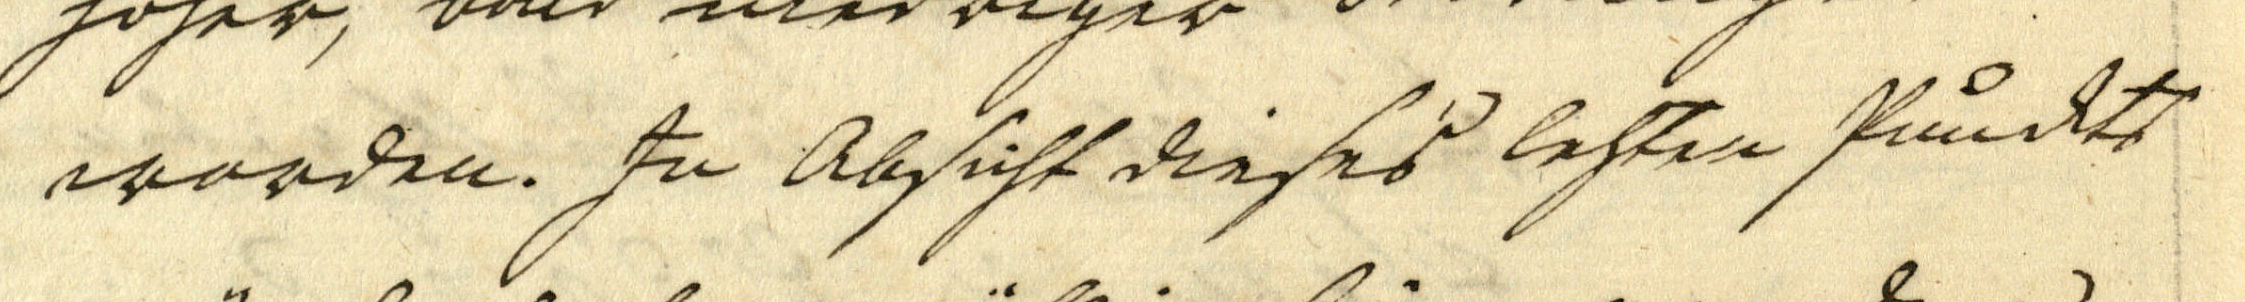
worden. In Absicht dieses letzten Punckts
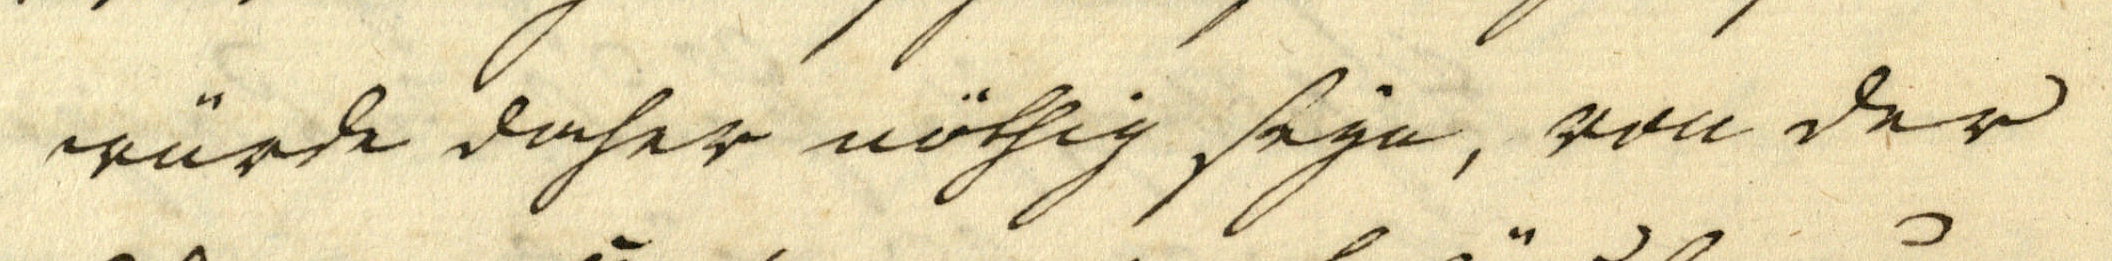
würde daher nöthig seyn, von der
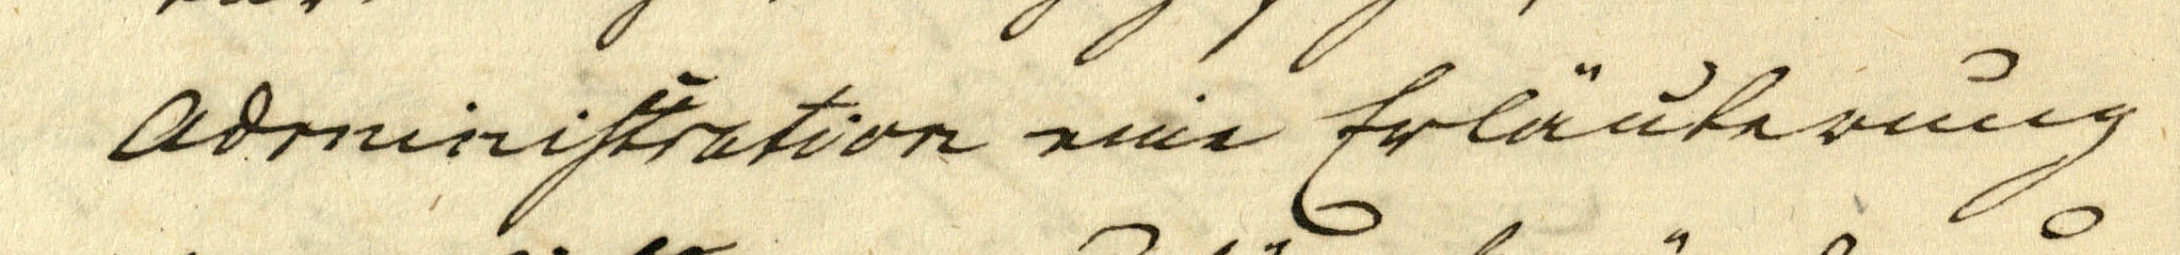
Administration eine Erläuterung
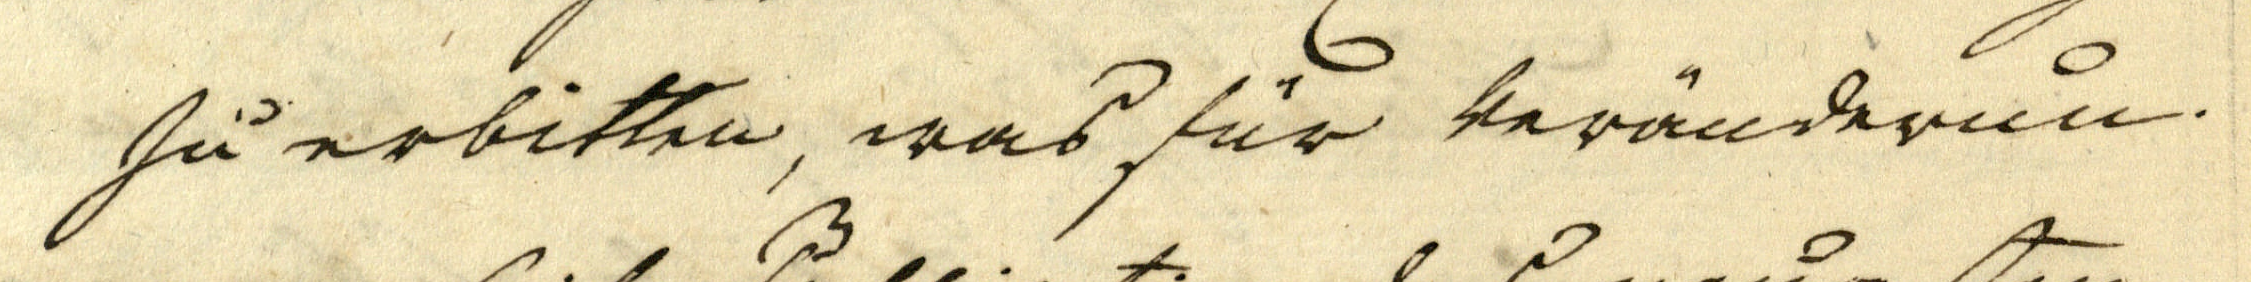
zu erbitten, was für Veränderun¬
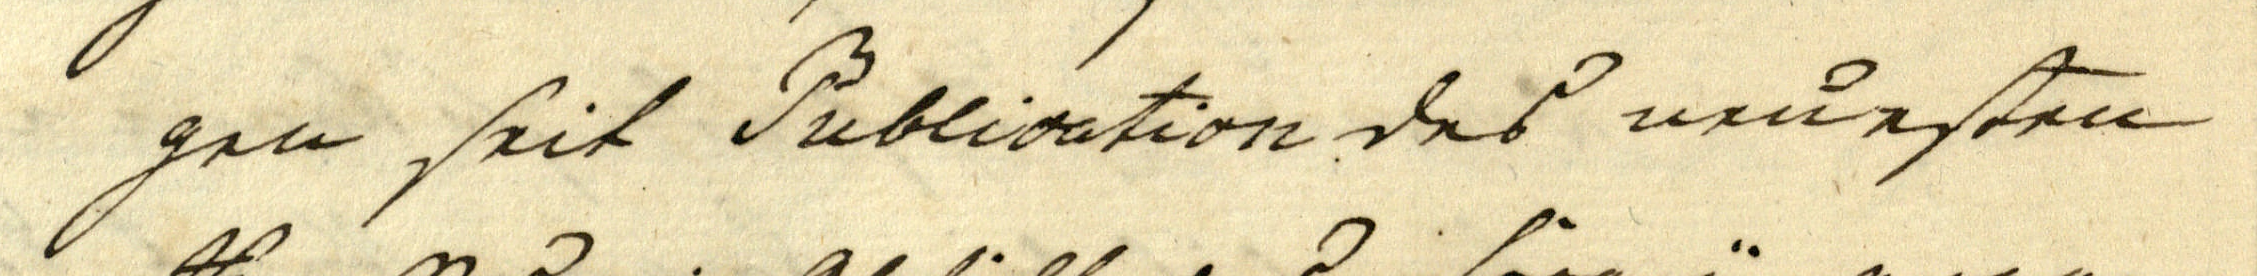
gen seit Publication des neuesten
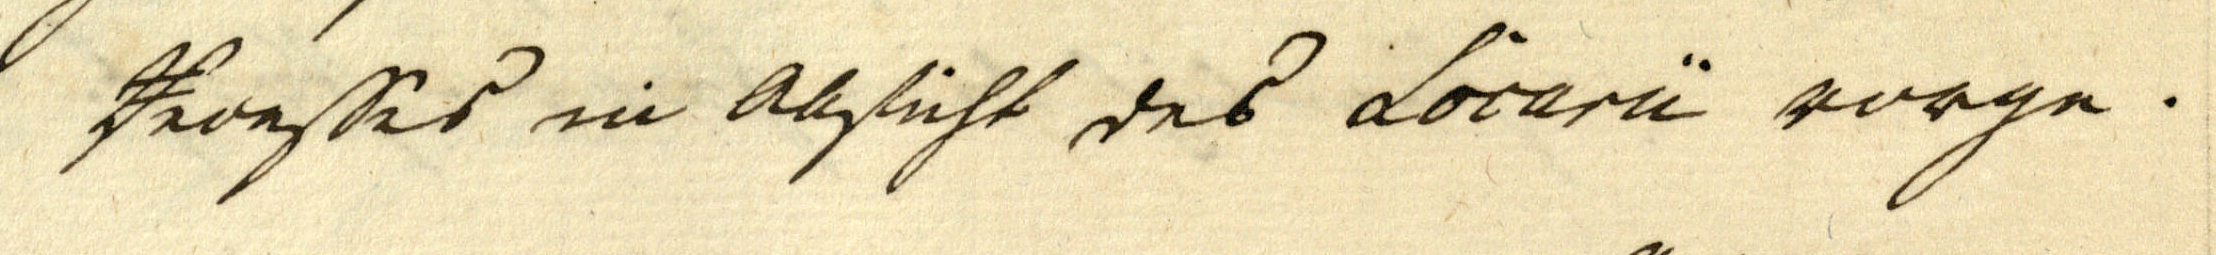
Recesses in Absicht des Locarii vorge¬
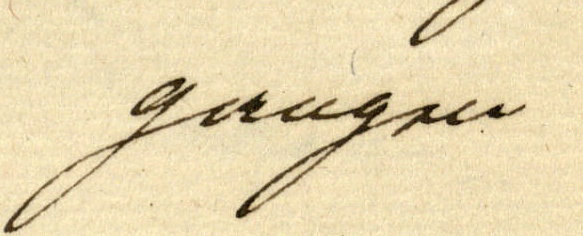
gangen
